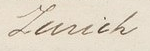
Zurich
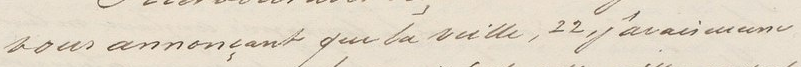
vous annonçant que la veille, 22, j'avais eu une
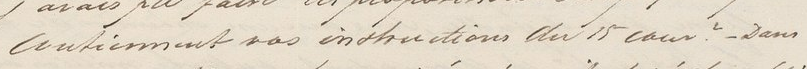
contiennent vos instructions du 15 Court. – Dans
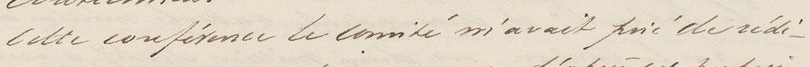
cette conférence le Comité m'avait prié de rédi-
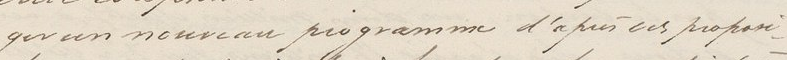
ger un nouveau programme d'après ces proposi-
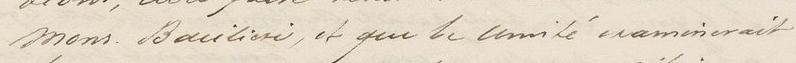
Mons. Bacilieri, et que le Comité examinerait
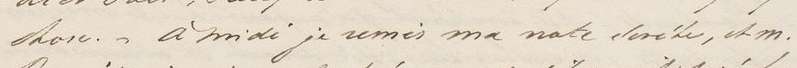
chose. – À midi je remis ma note écrite, et M.
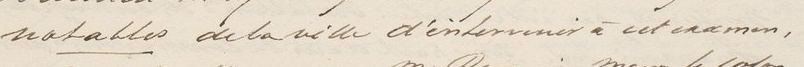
notables de la ville d'intervenir à cet examen,
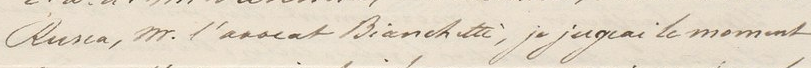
Rusca, M. l'avocat Bianchetti, je jugeai le moment
